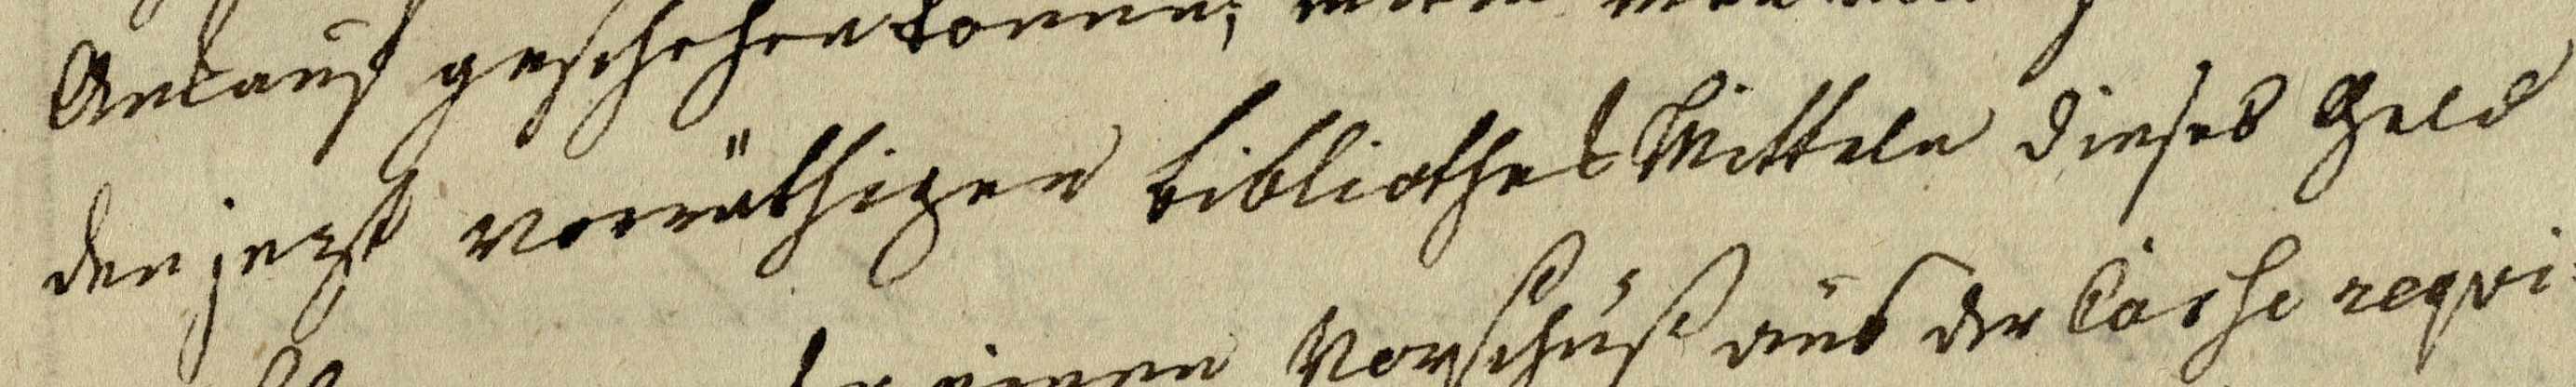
den jezt vorräthigen Bibliothek Mitteln dieses Geld
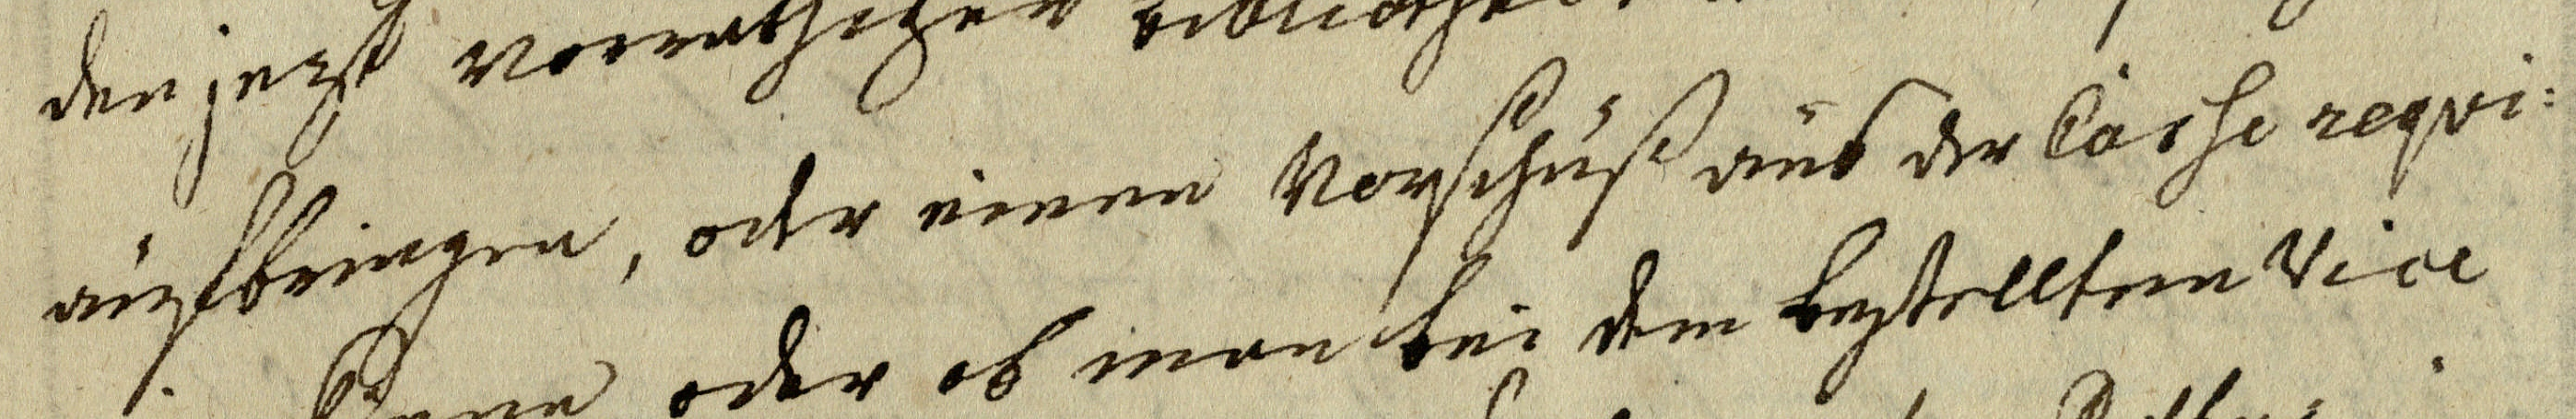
aufbringen, oder einen Vorschuß aus der Casse requi¬
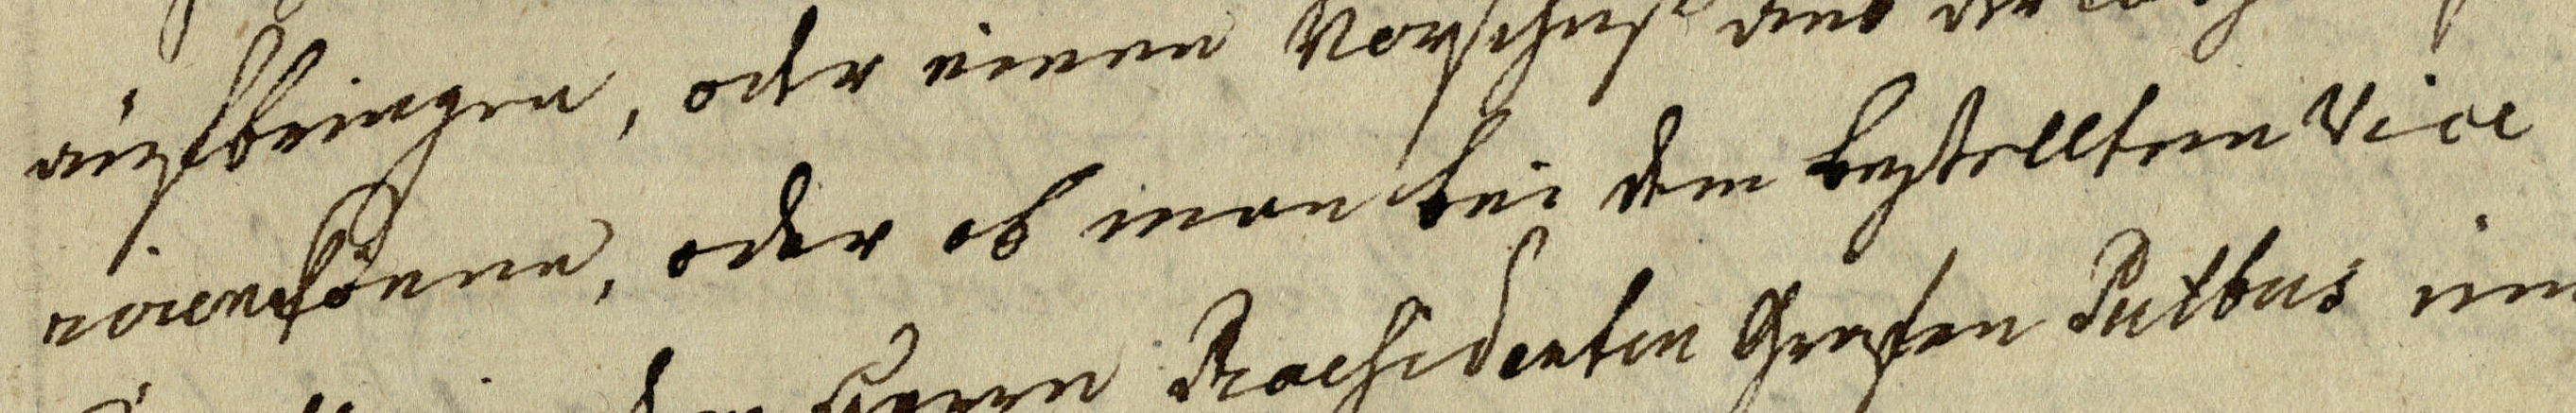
riren könne, oder ob man bei dem bestellten Vice
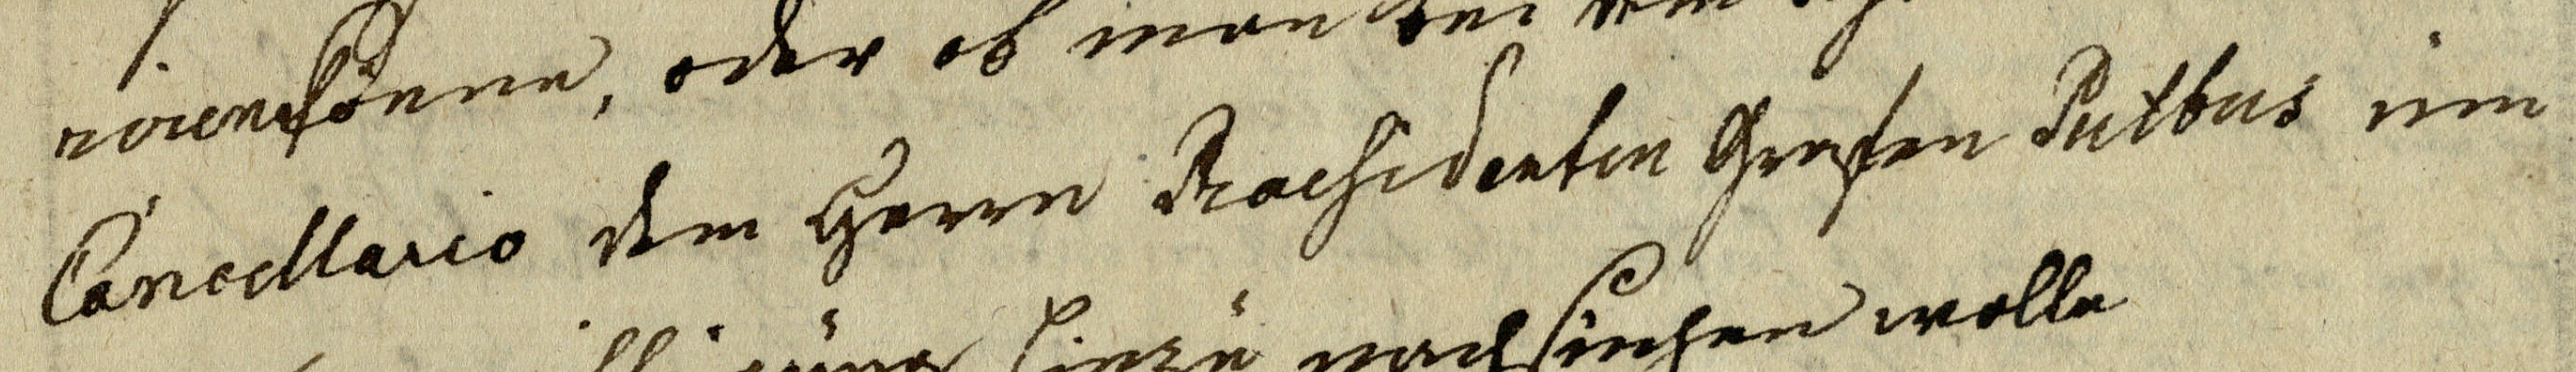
Cancellario dem Herrn Praesidenten Grafen Putbus um
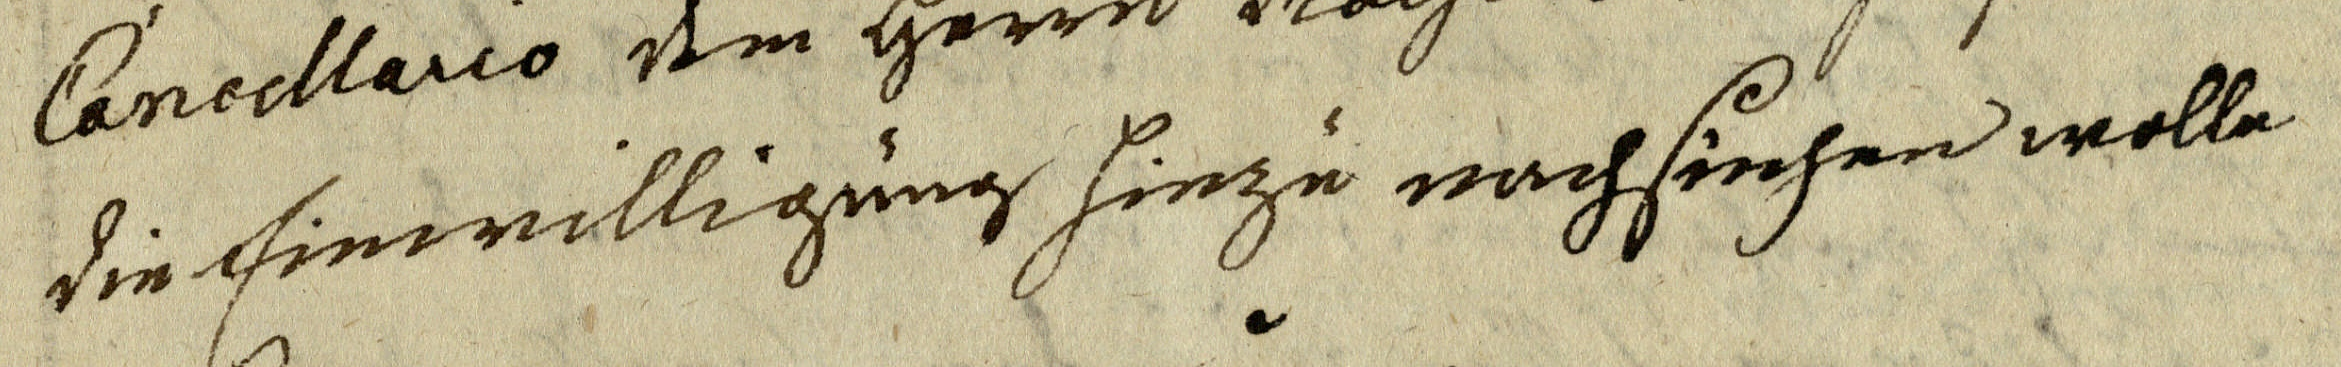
die Einwilligung hiezu nachsuchen wolle
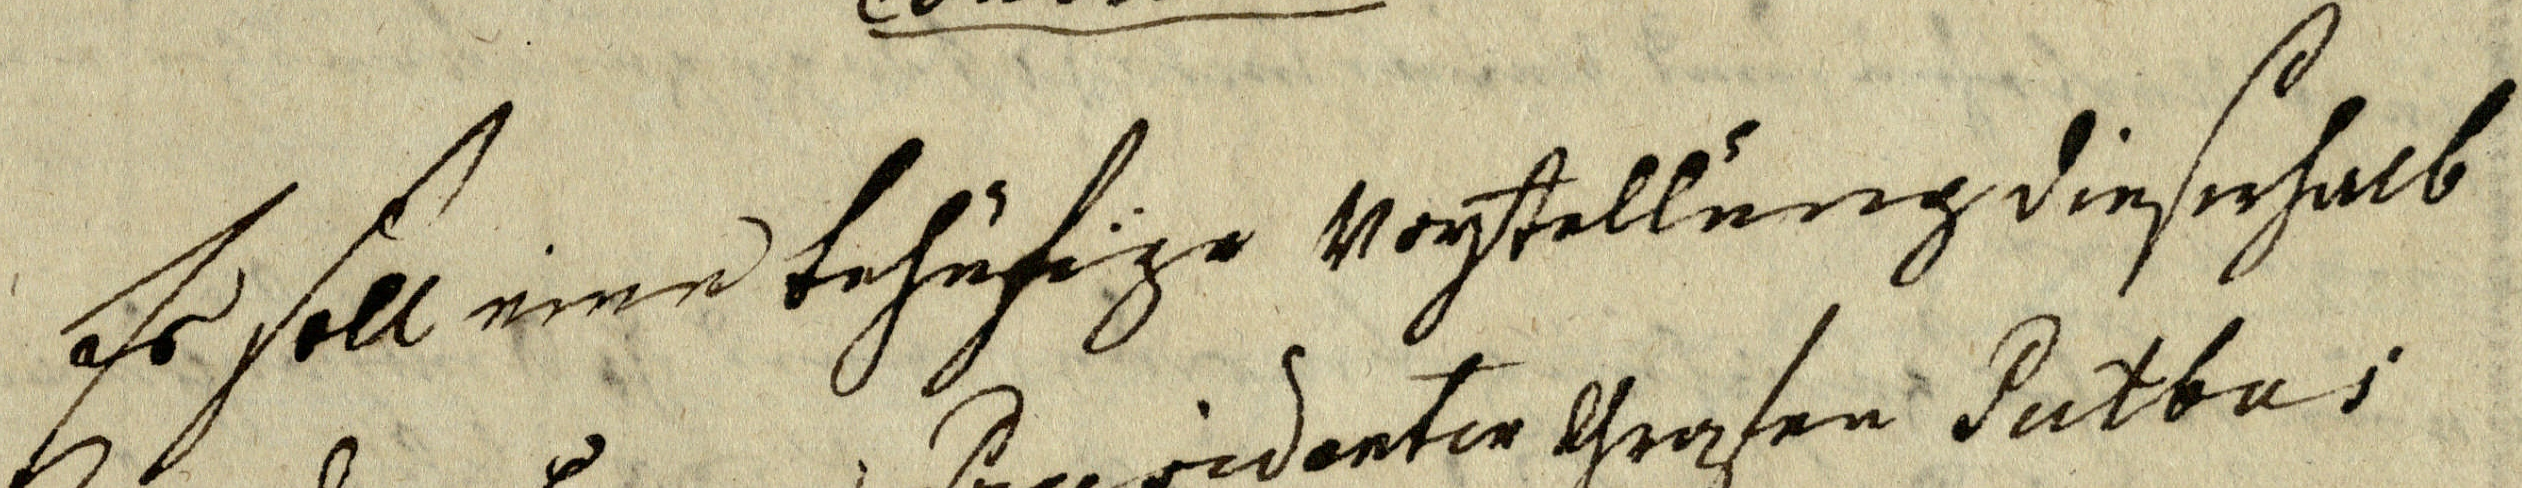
Es soll eine behufige Vorstellung dieserhalb
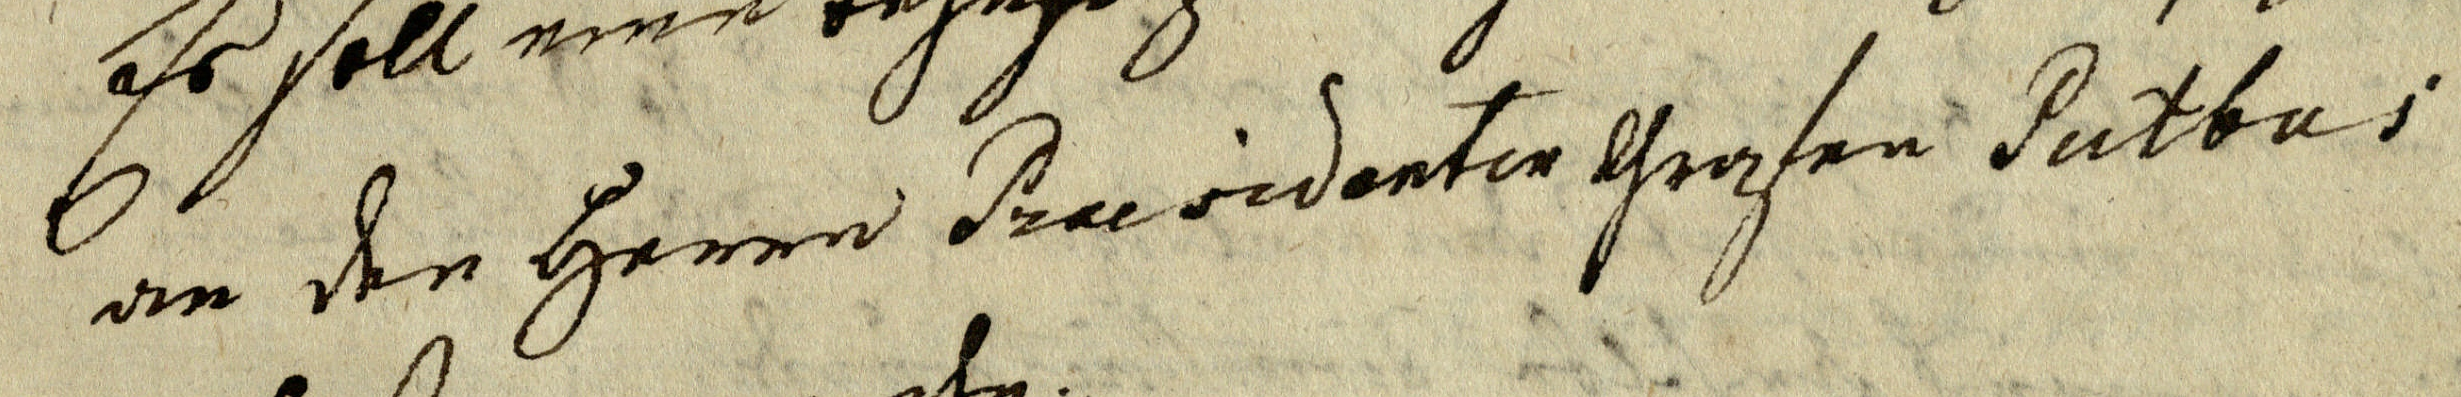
an den Herrn Praesidenten Grafen Putbus
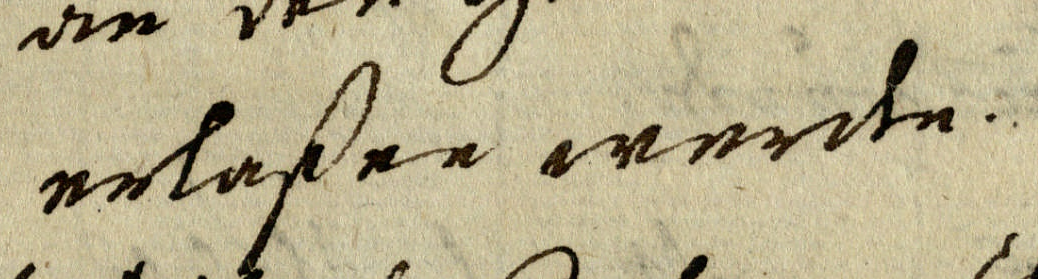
erlaßen werden.
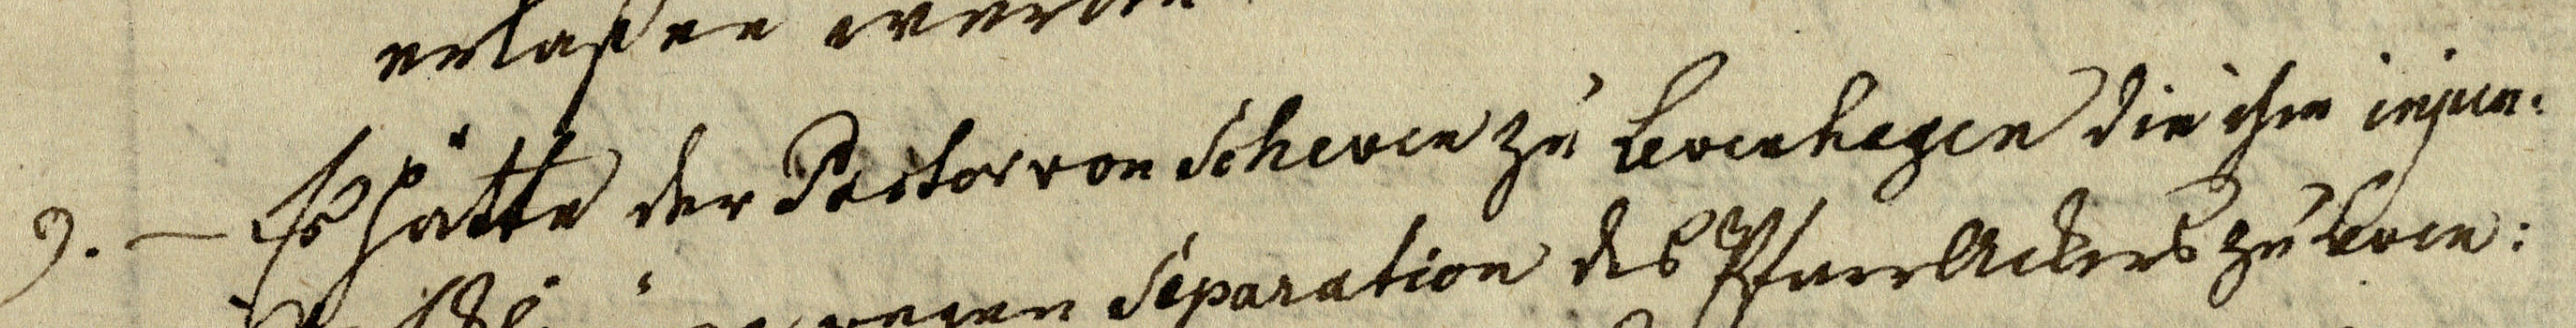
9. Es hätte der Pastor von Scheven zu Levenhagen die ihm injun¬
